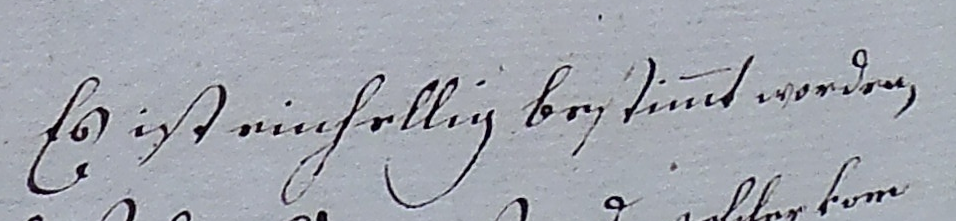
Es ist einhellig bestim̅t worden,
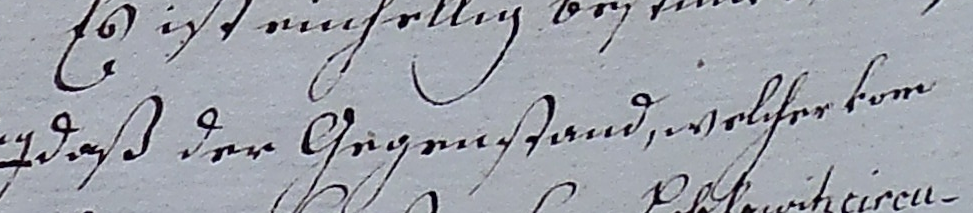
daß der Gegenstand, welcher vom
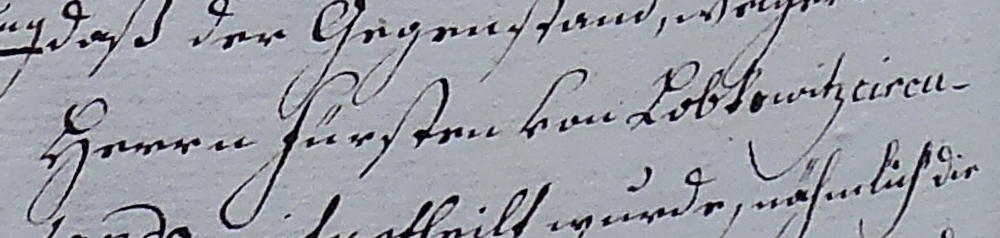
Herrn Fürsten von Lobkowitz circu¬
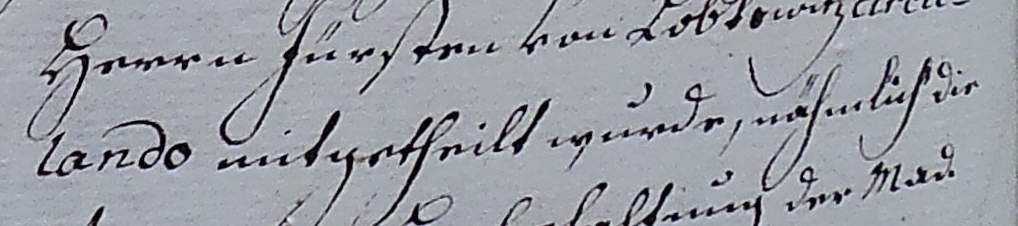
lando mitgetheilt wurde, nähmlich der
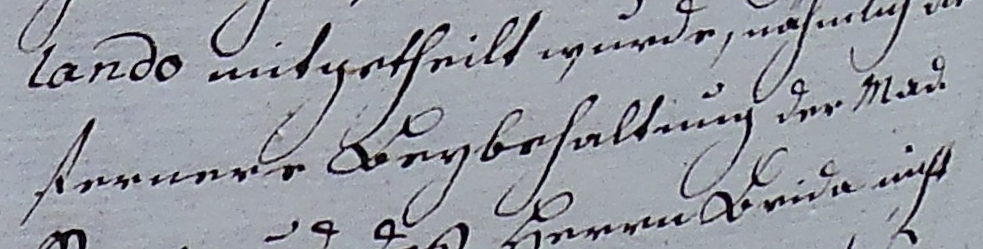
fernere Beybehaltung der Mad.
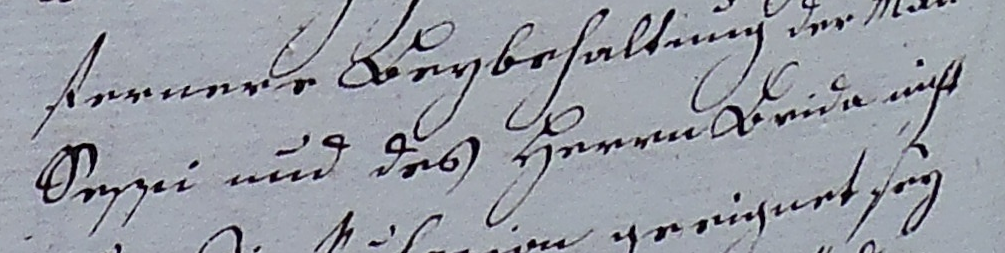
Sessi und des Herrn Brida nicht
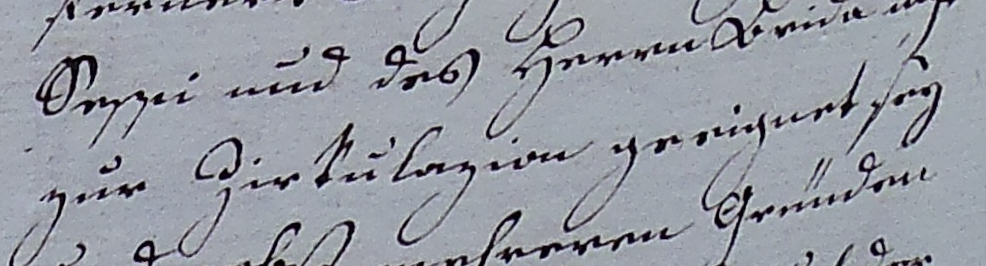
zur Zirkulazion geeignet sey
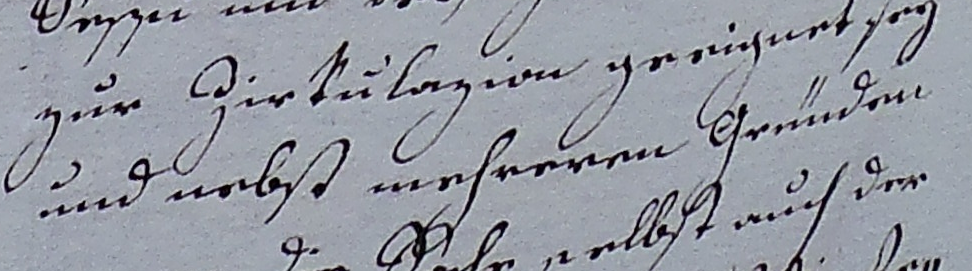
und nebst mehreren Gründen
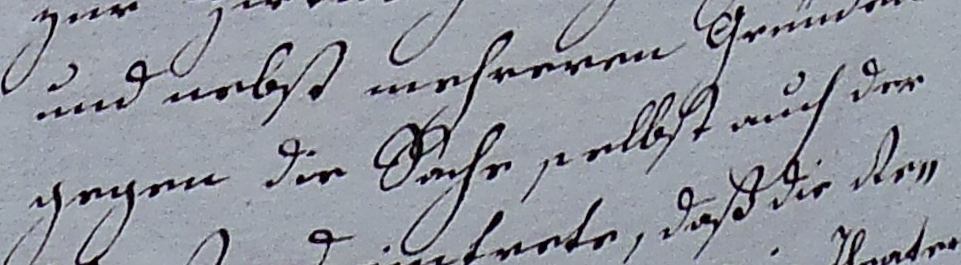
gegen die Sache selbst auch der
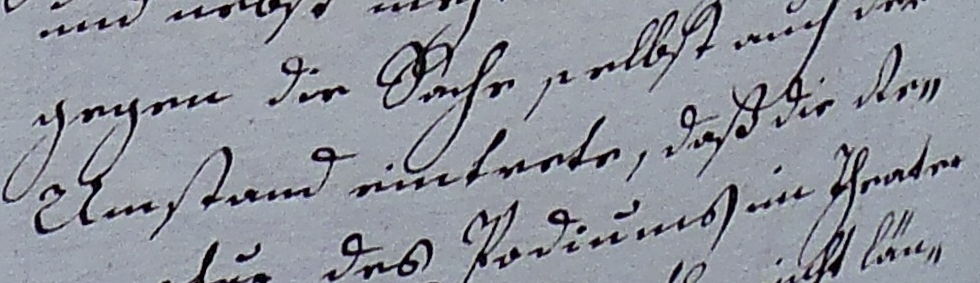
Umstand eintrete, daß die Re¬
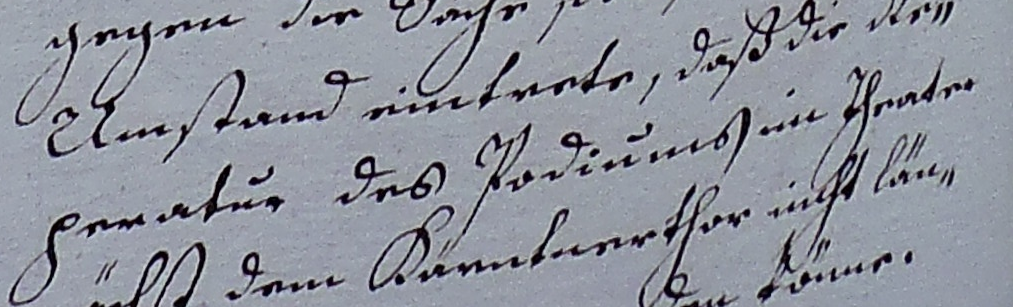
peratur des Podiums im Theater
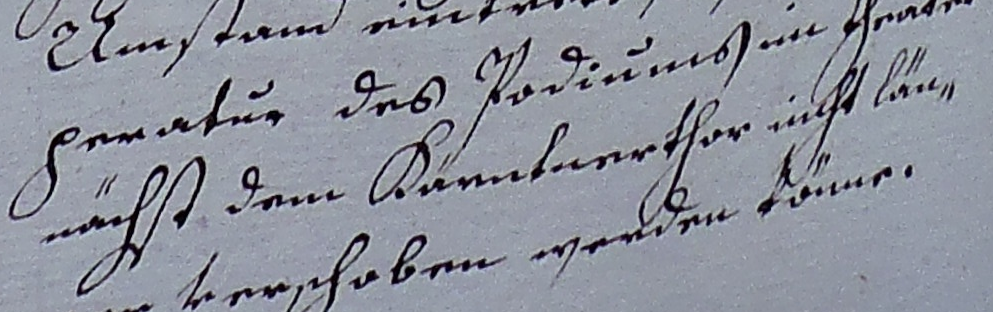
nächst dem Kärnterthor nicht län¬
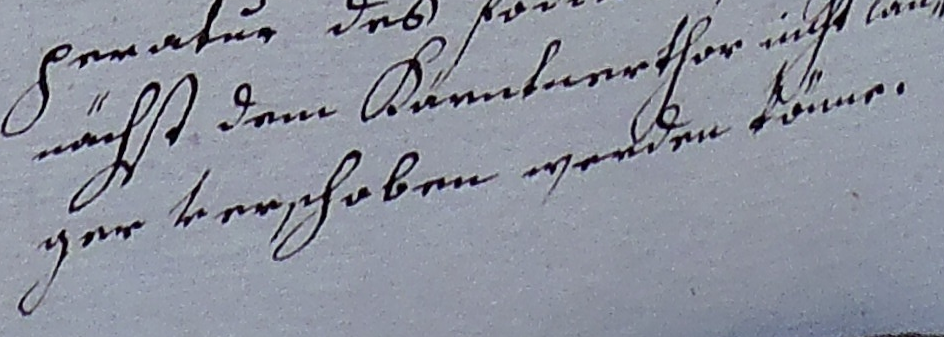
ger verschoben weden könne.
